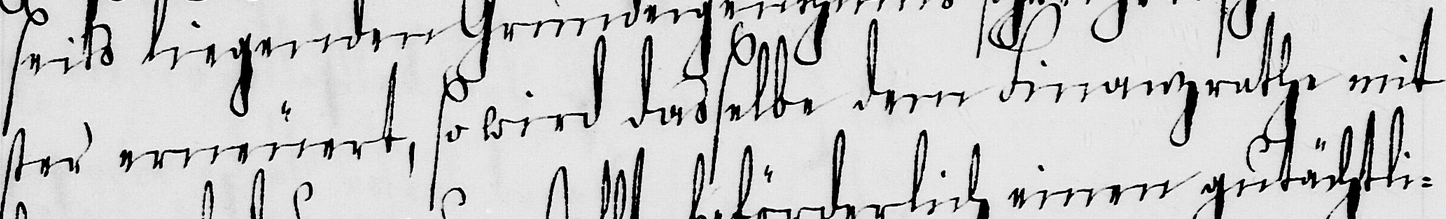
ster erneuert, so wird dasselbe dem Finanzrathe mit
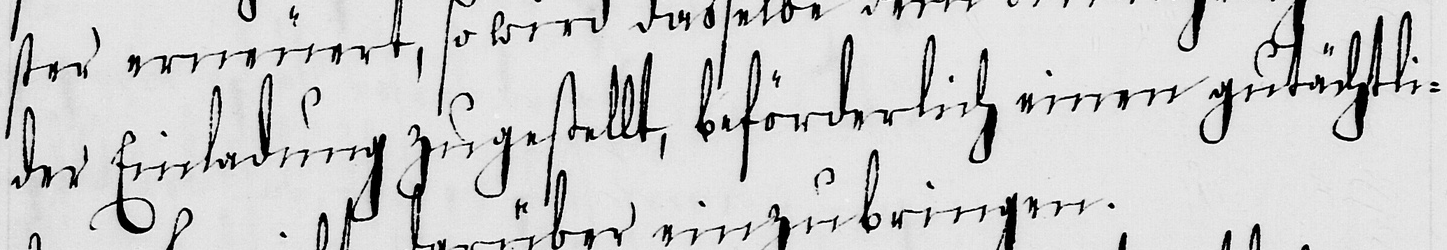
der Einladung zugestellt, beförderlich einen gutächtli¬
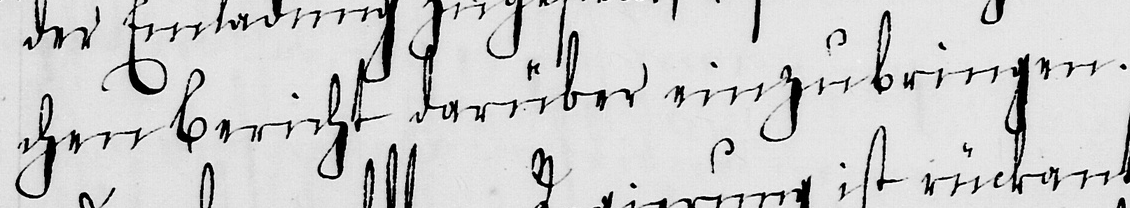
chen Bericht darüber einzubringen.
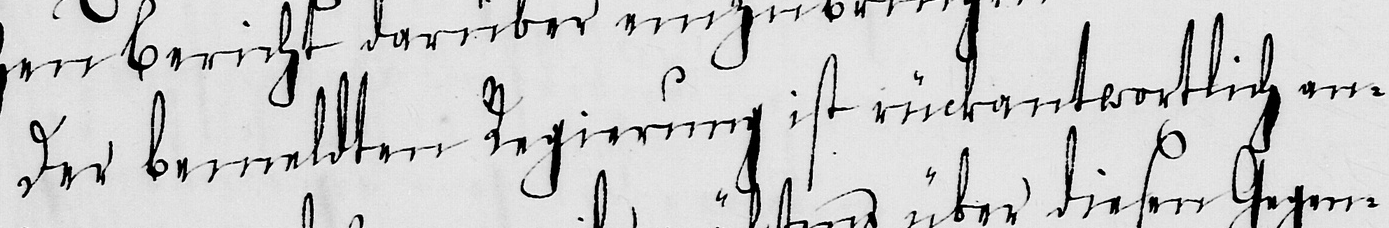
Der bemeldten Regierung ist rückantwortlich an¬
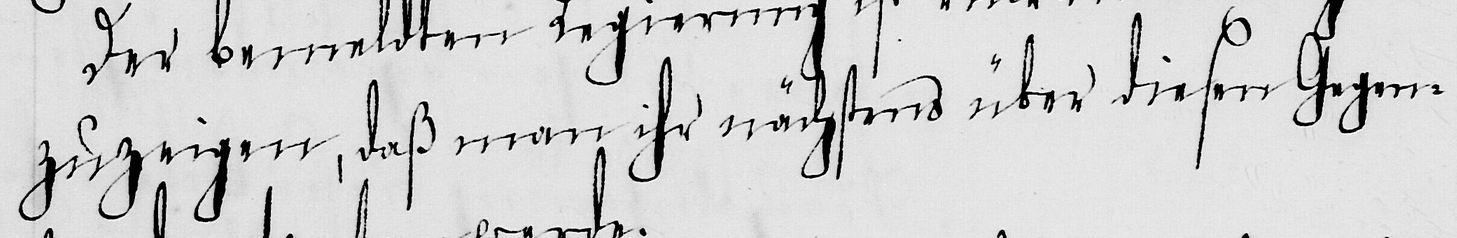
zuzeigen, daß man ihr nächstens über diesen Gegen¬
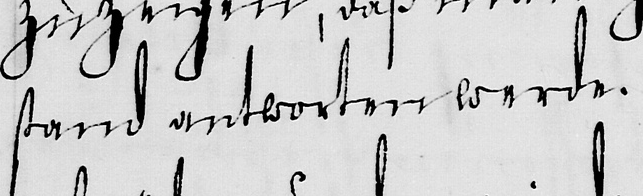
stand antworten werde.
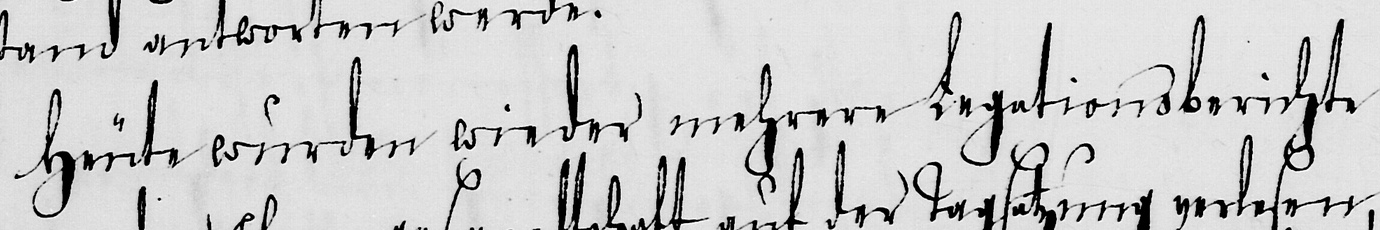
Heute wurden wieder mehrere Legationsberichte
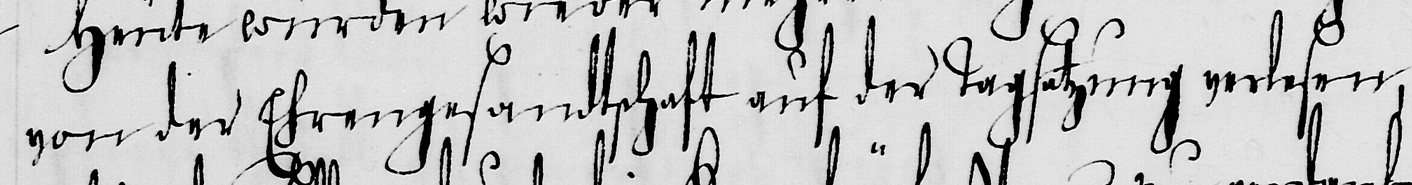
von der Ehrengesandtschaft auf der Tagsatzung verlesen,
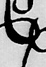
der
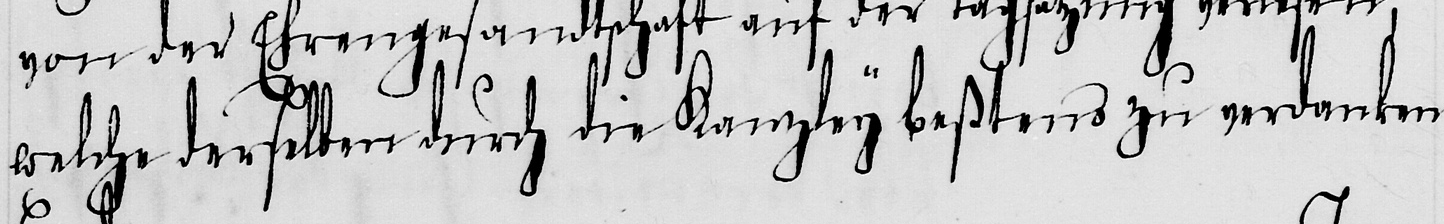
welche derselben durch die Kanzley beßtens zu verdanken
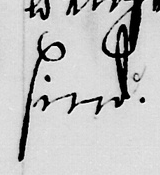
sind.
